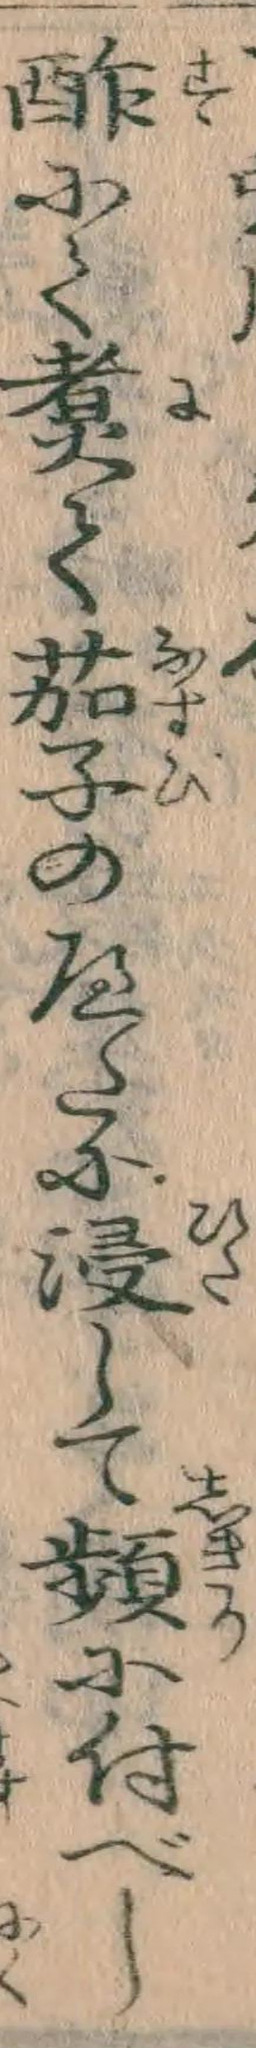酢にて煮て茄子のへたに浸して頻に付べし
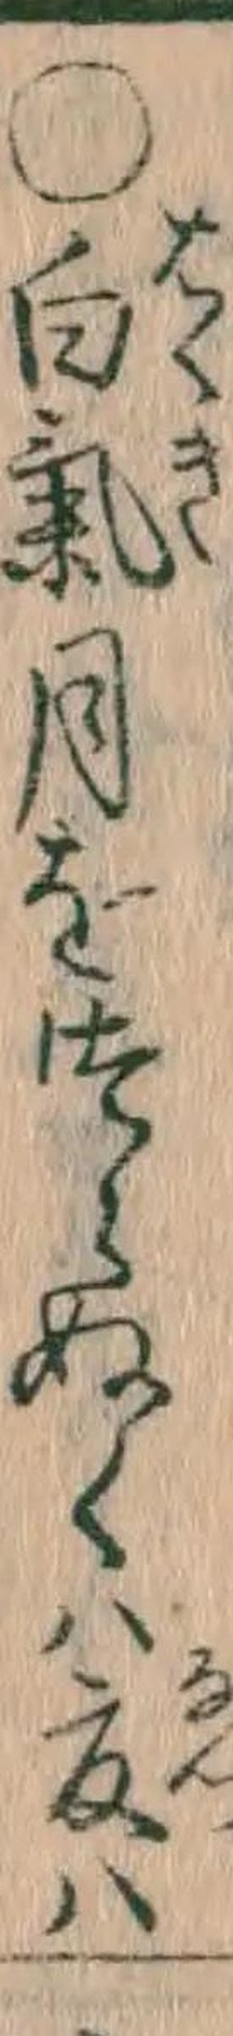○白気月をつらぬくは夏は
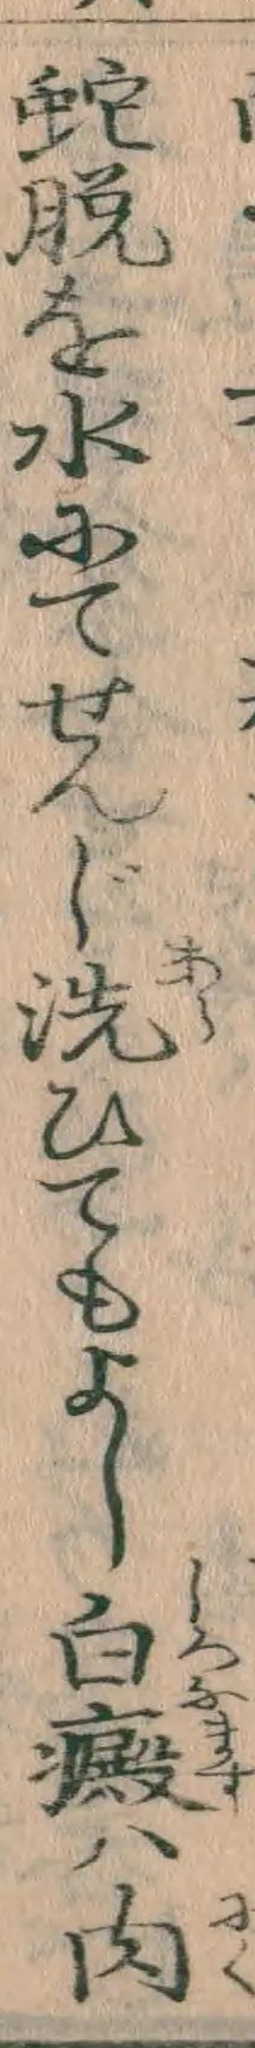蛇脱を水にてせんじ洗ひてもよし白癜は肉
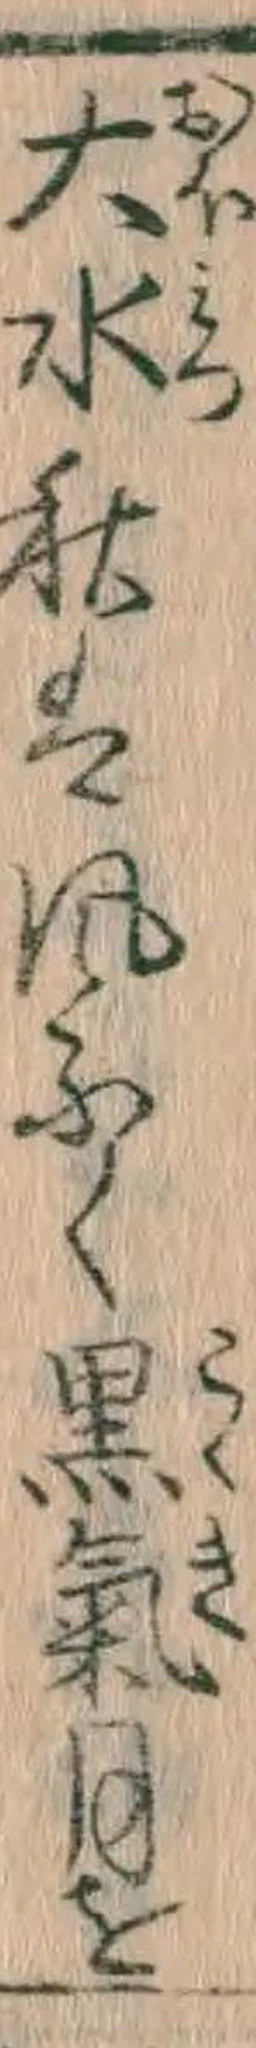大水秋は風ふく黒気月を
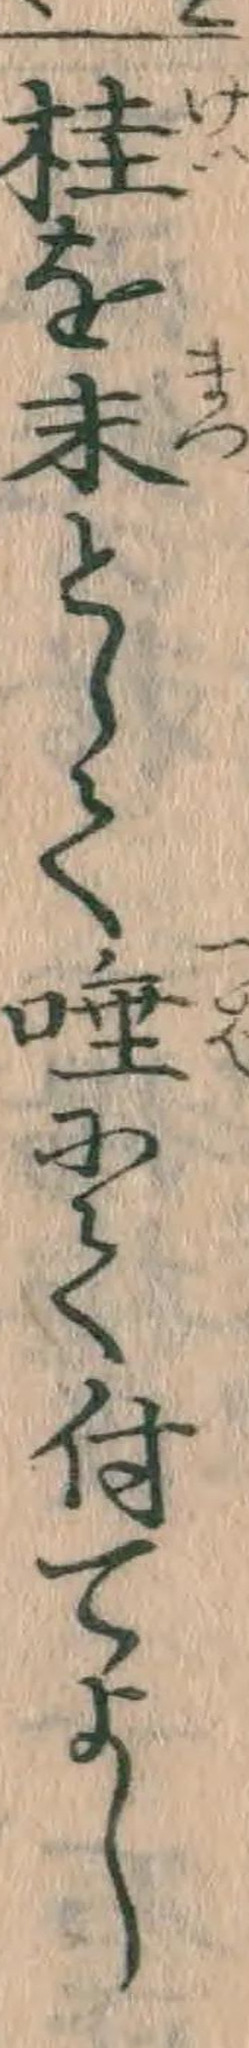桂を末として唾にて付てよし
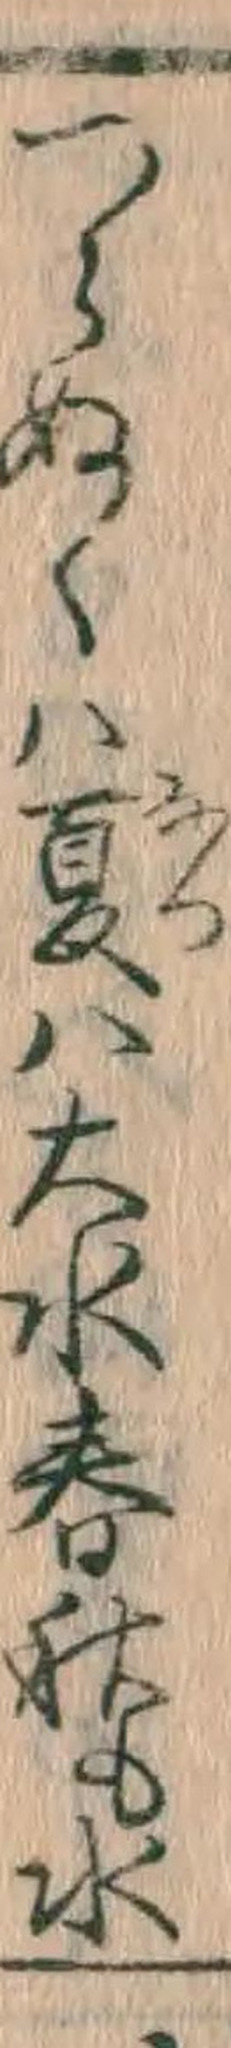つらぬくは夏は大水春秋も水
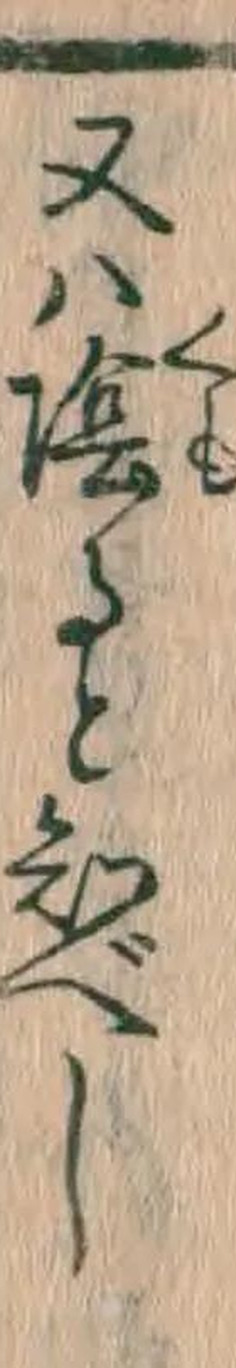又は陰ると知べし
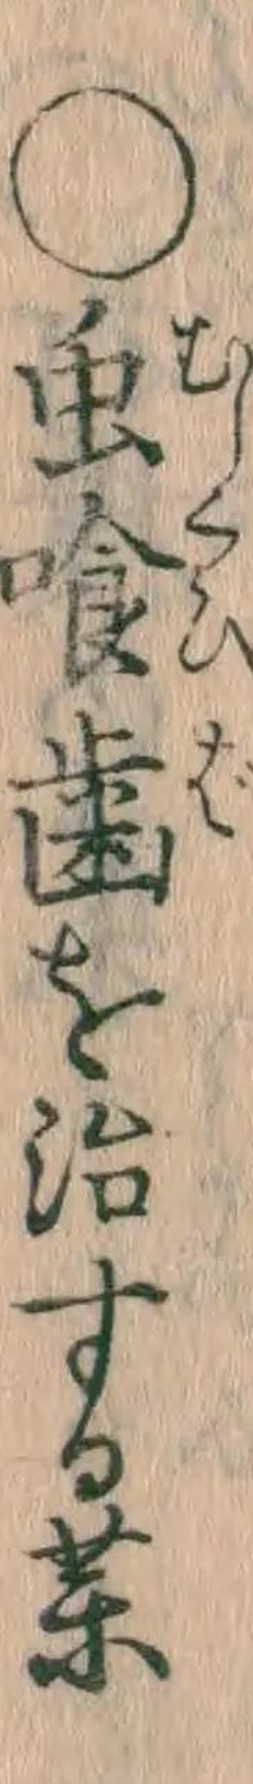○虫喰歯を治する薬
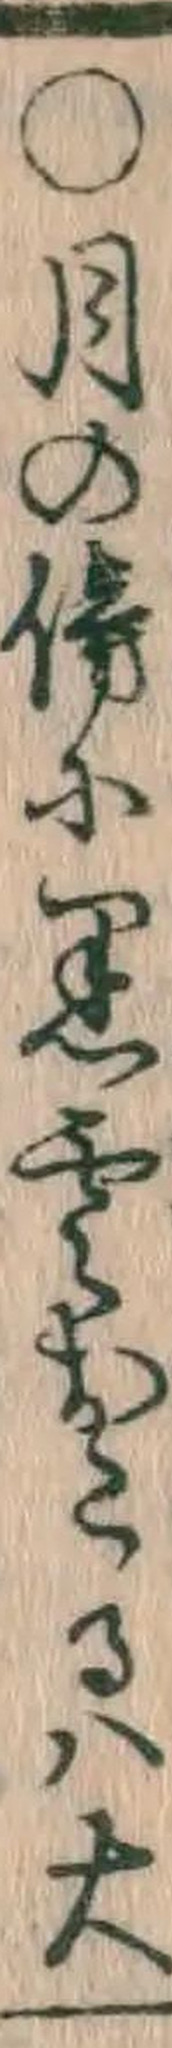○月の傍に黒雲おこるは大
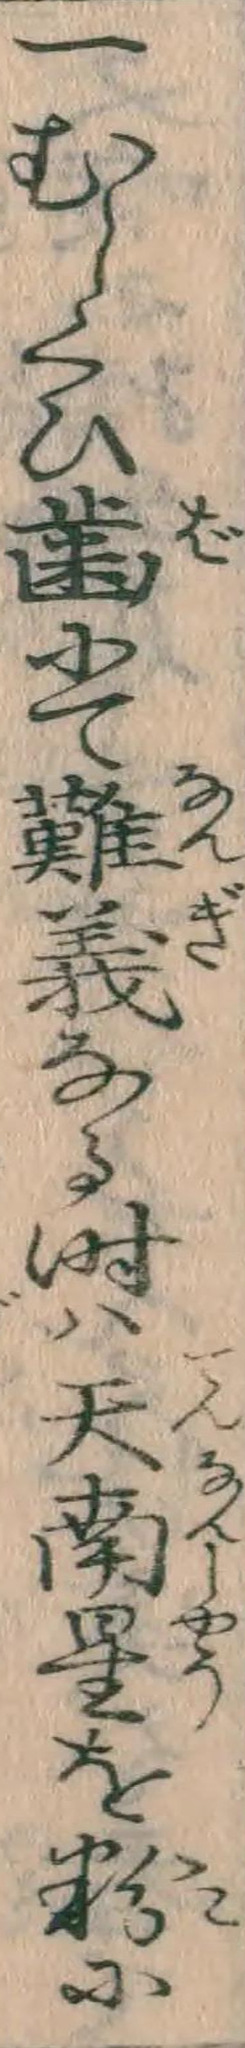一むしくひ歯にて難義なる時は天南星を粉に
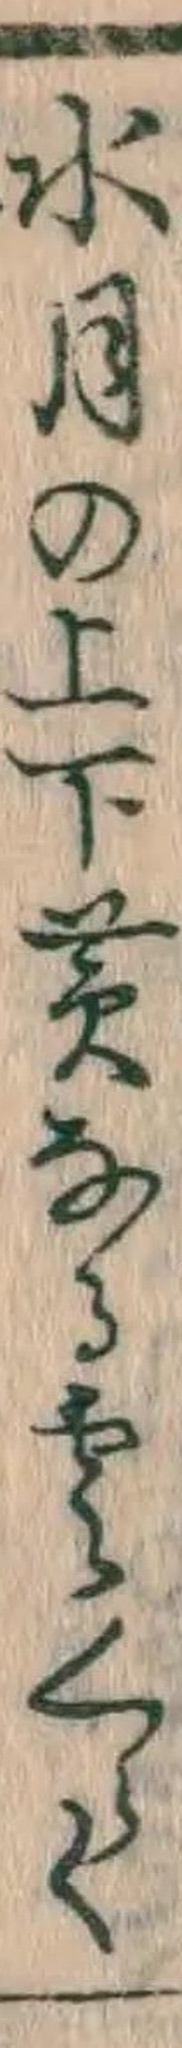水月の上下黄なる雲くらく
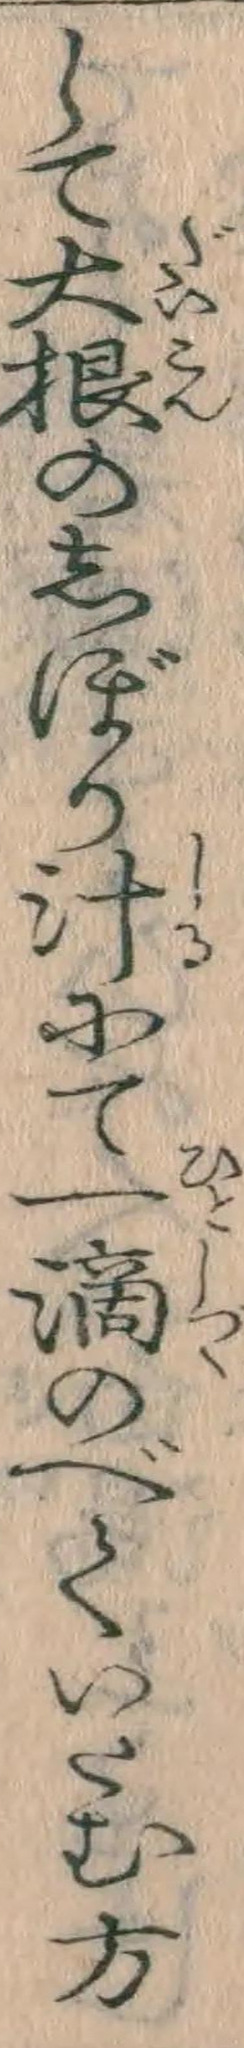して大根のしぼり汁にて一滴のべていたむ方
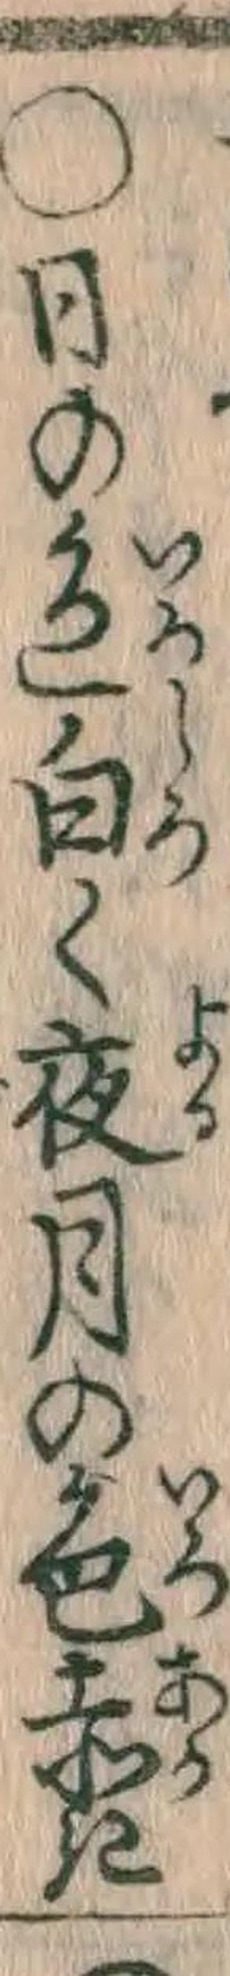○日の色白く夜月の色赤き
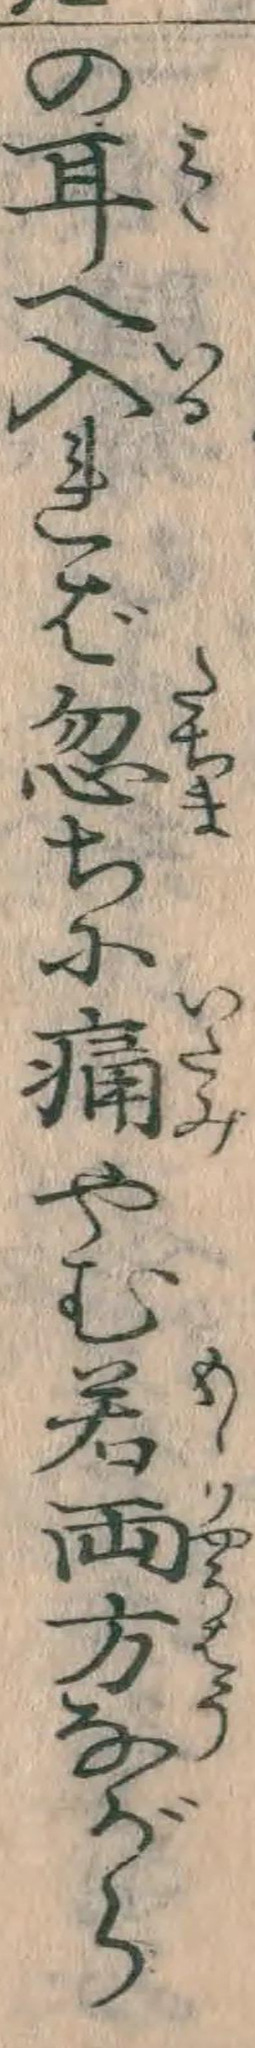の耳へ入れば忽ちに痛やむ若両方ながら
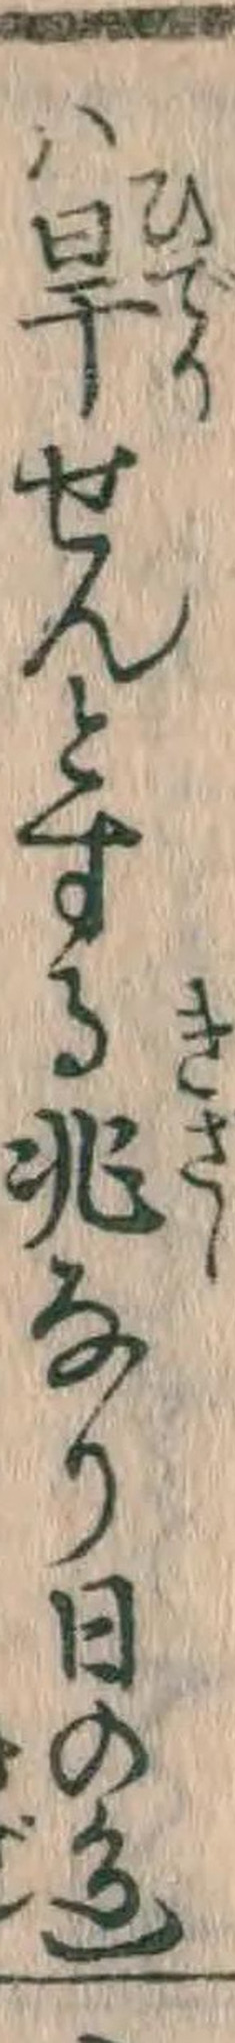は旱せんとする兆なり日の色
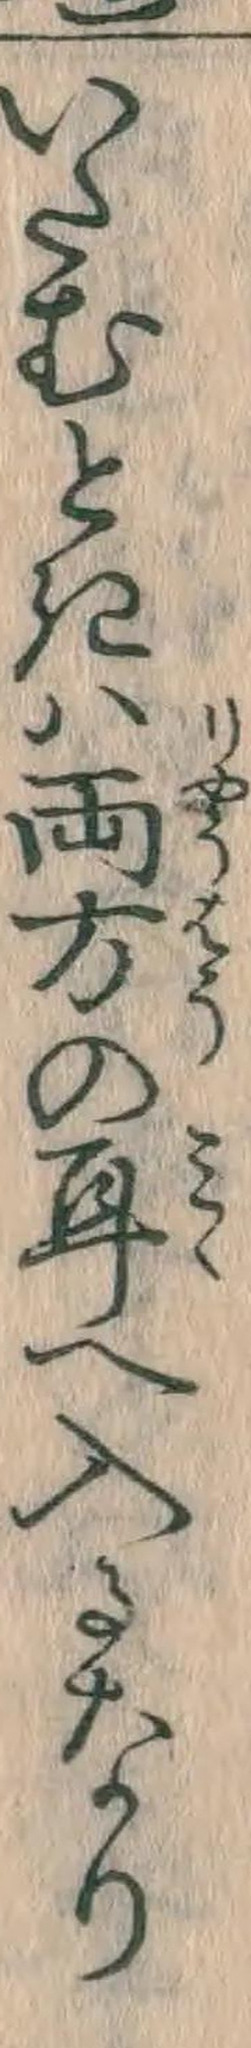いたむときは両方の耳へ入るなり
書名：広益秘事大全 3巻. [3]
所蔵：国立国会図書館 National Diet Library, JAPAN
